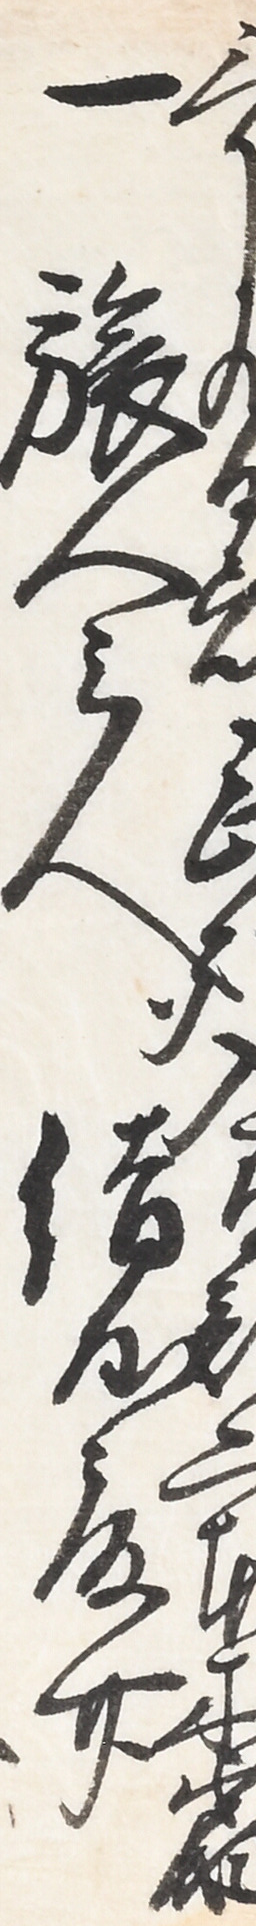一旅人三人絹屋藤助
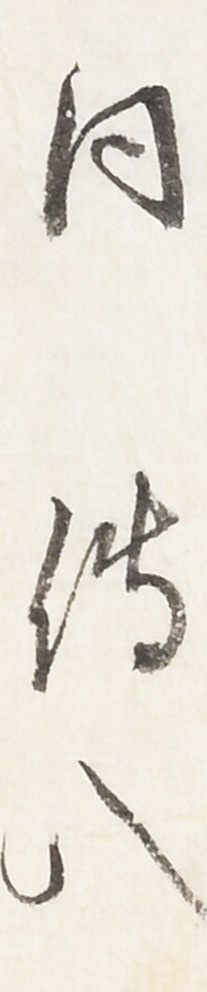同伝八
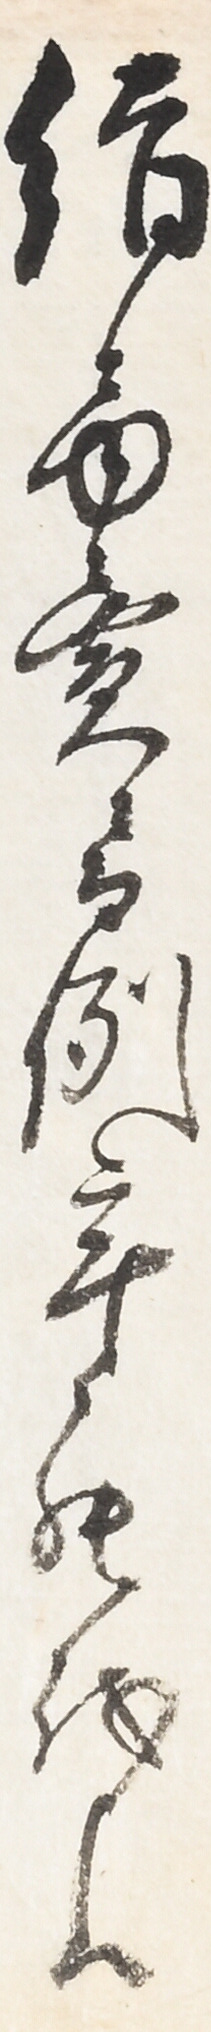絹商売二而例年罷越申候
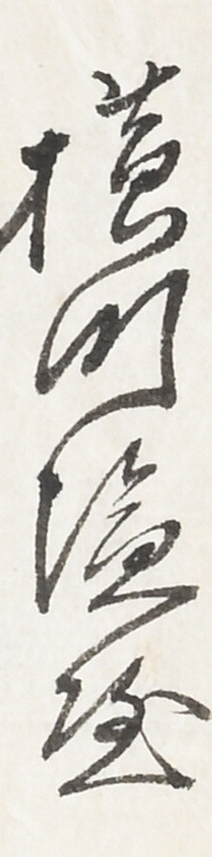横町塩屋
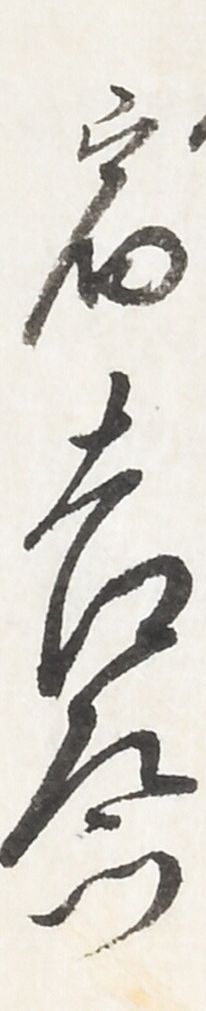宿吉左衛門
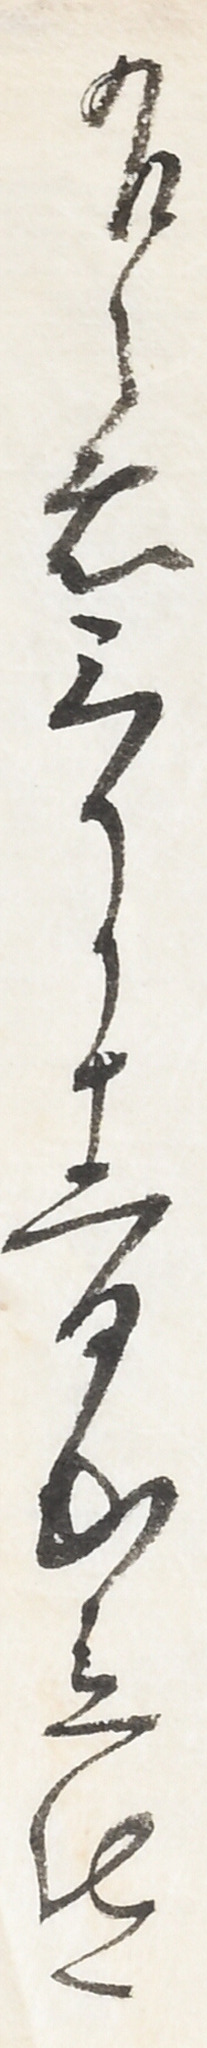右之者三月十二日出立仕候
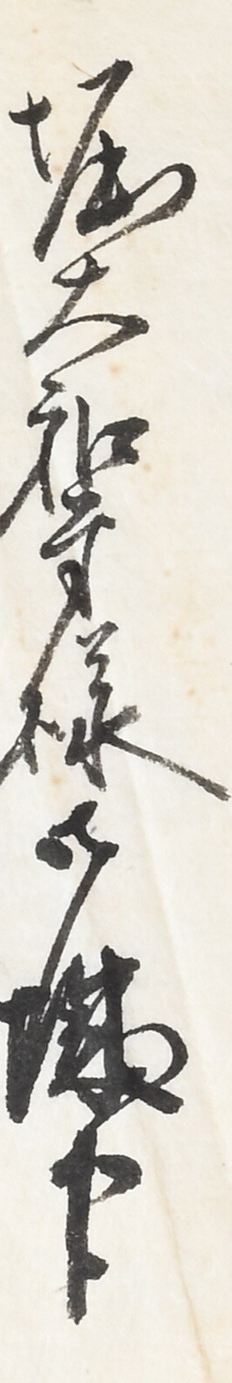堀大和守様御城下
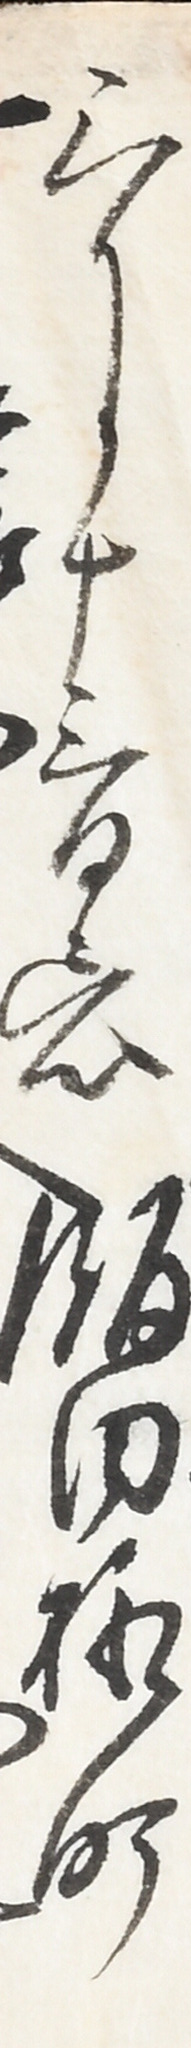三月十日着飯田各町
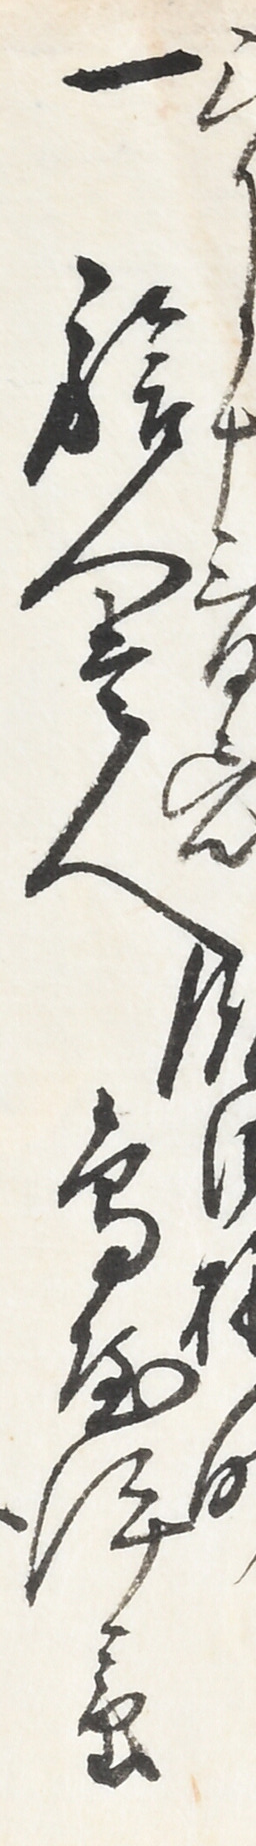一旅人壱人鳥屋伊兵衛
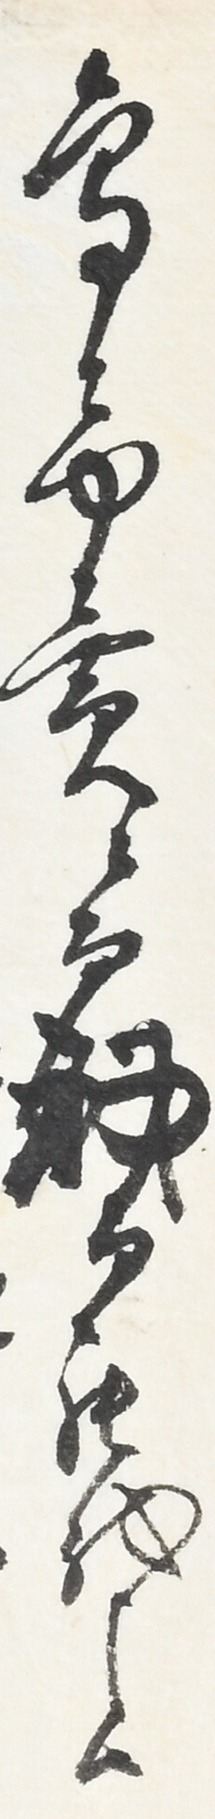鳥商売ニ而初而罷越申候
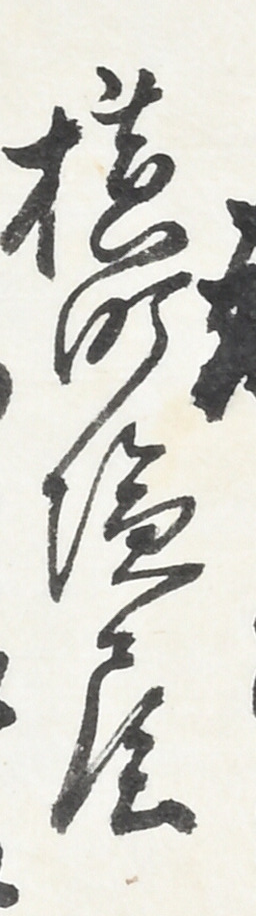横町塩屋
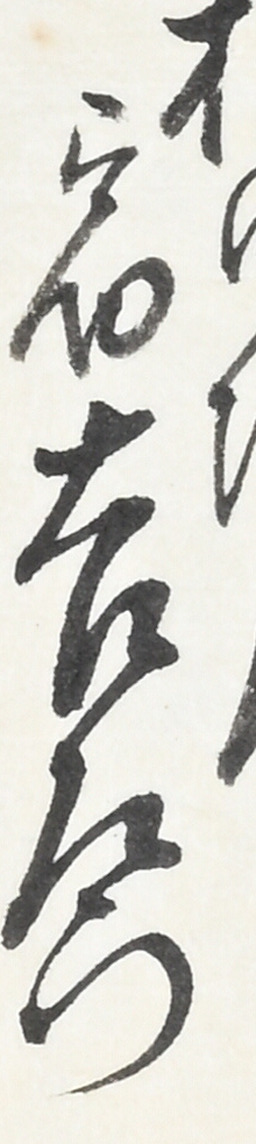宿吉左衛門
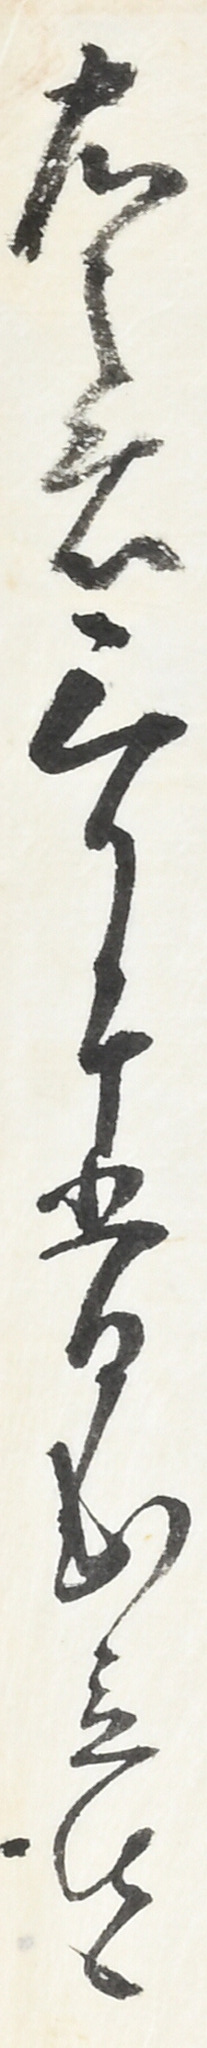右之者三月十二日出立仕候

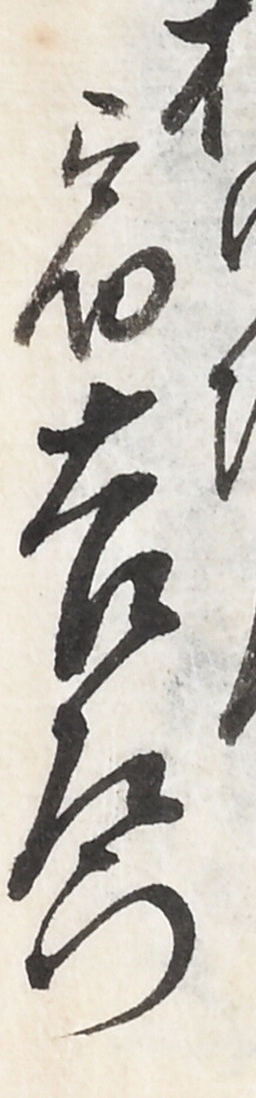宿金右衛門
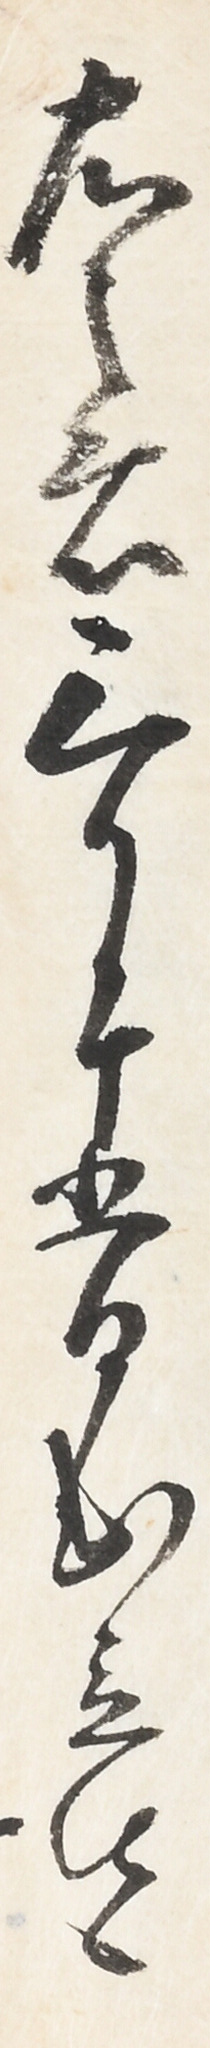右之者三月廿日出立仕候
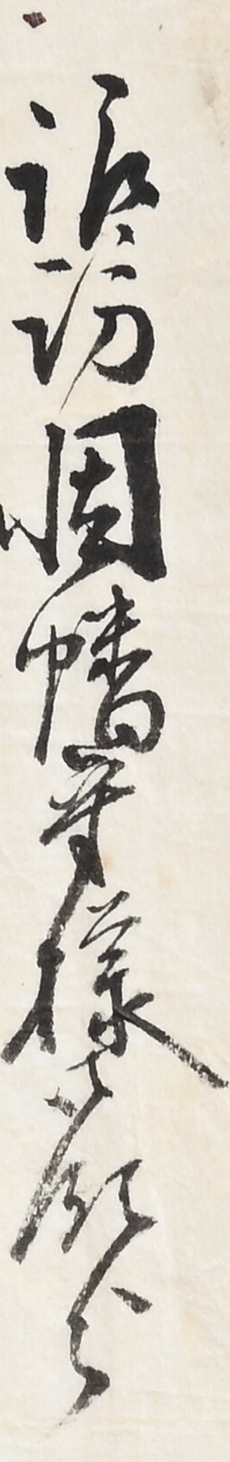諏訪因幡守様御領分
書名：旅人泊控帳
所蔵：伊那市立高遠町図書館・合同会社AMANE
